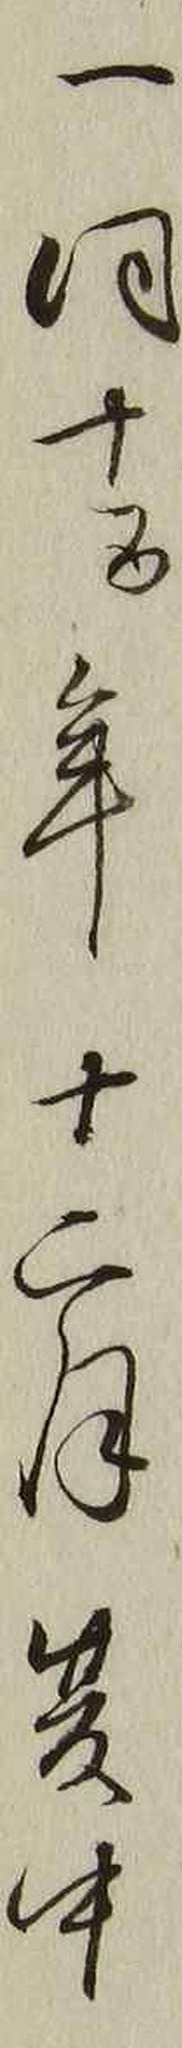一同十酉年十二月夏中
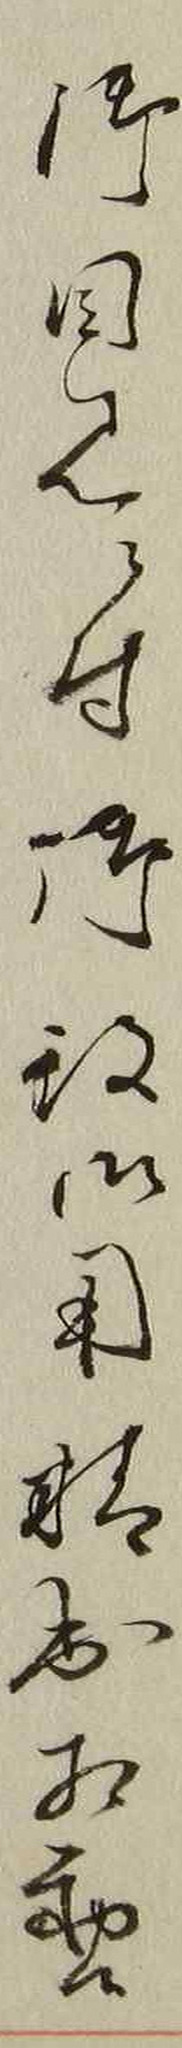御目見ニ付御役御用精出相勤候
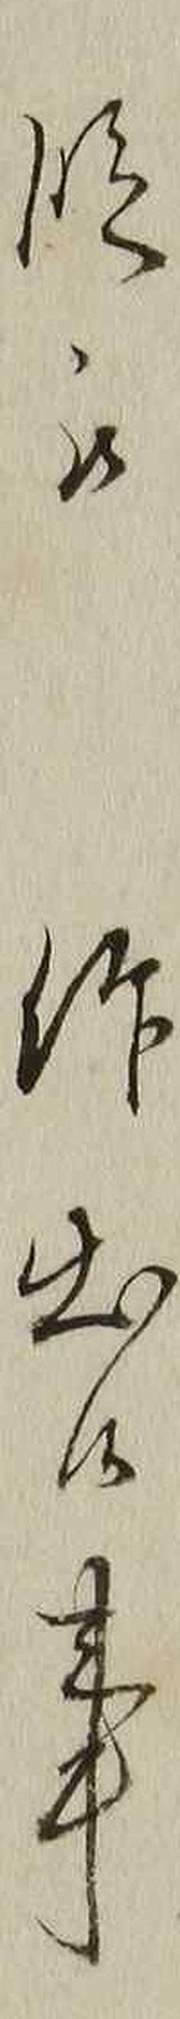段被仰出候事
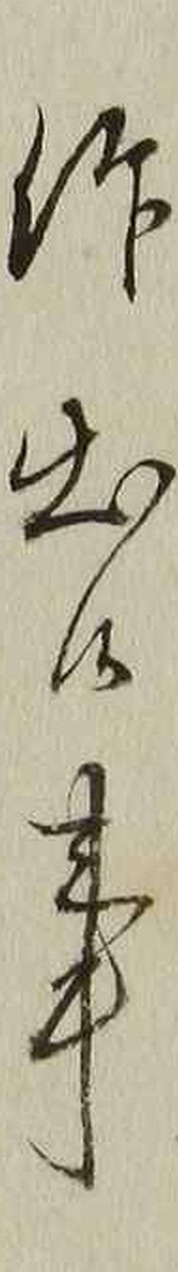仰出候事
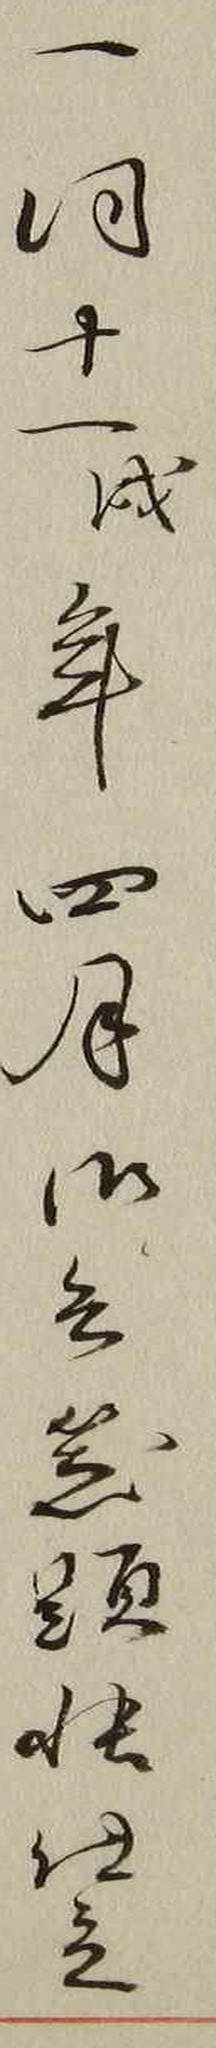一同十一戌年四月御兵器題帳仕立
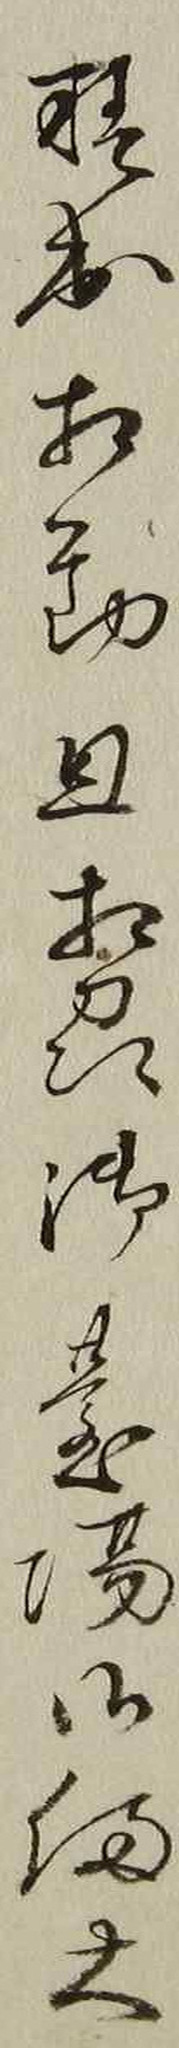精出相勤且相州御台場御備大
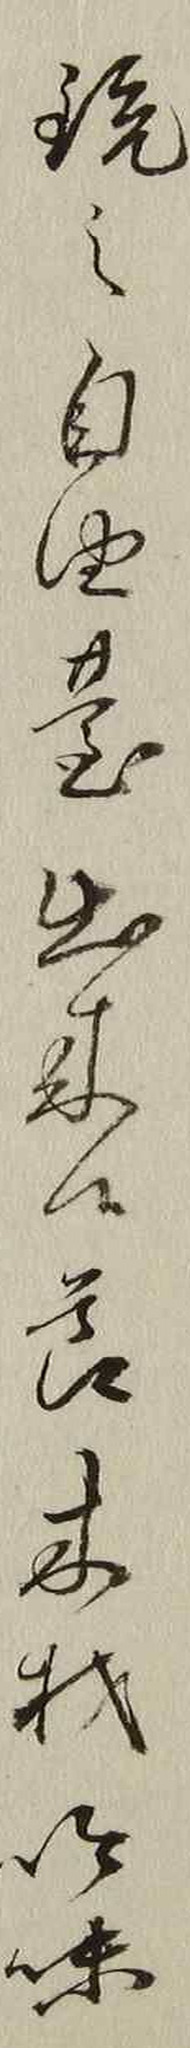銃之自由台出来候節木材吟味
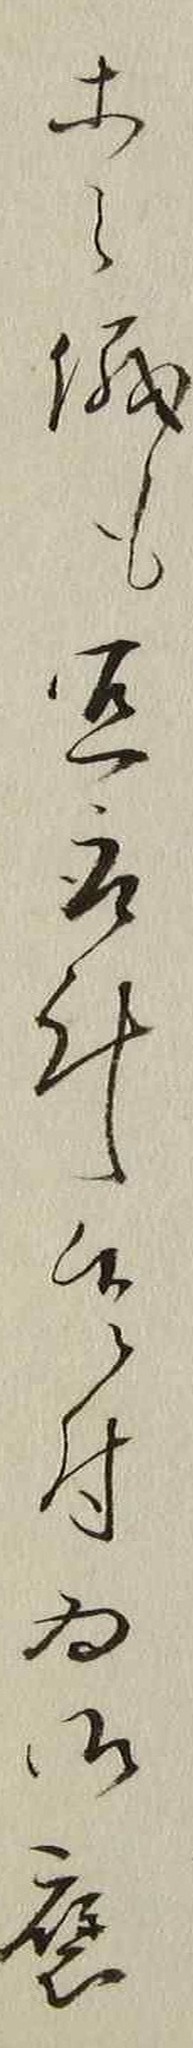等之儀も宜取計候ニ付為御褒
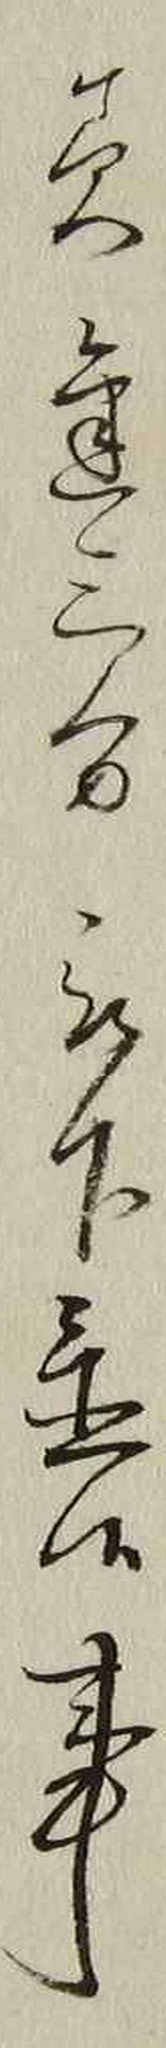美金三分被下置候事
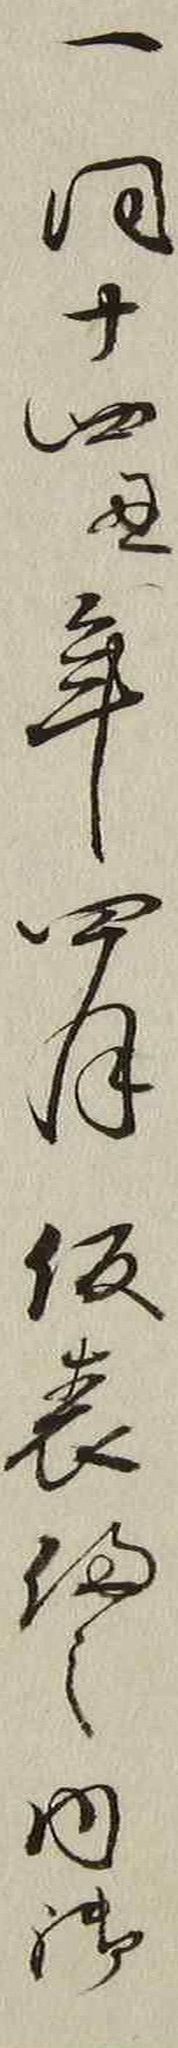一同十四丑年四月仮表備之内御
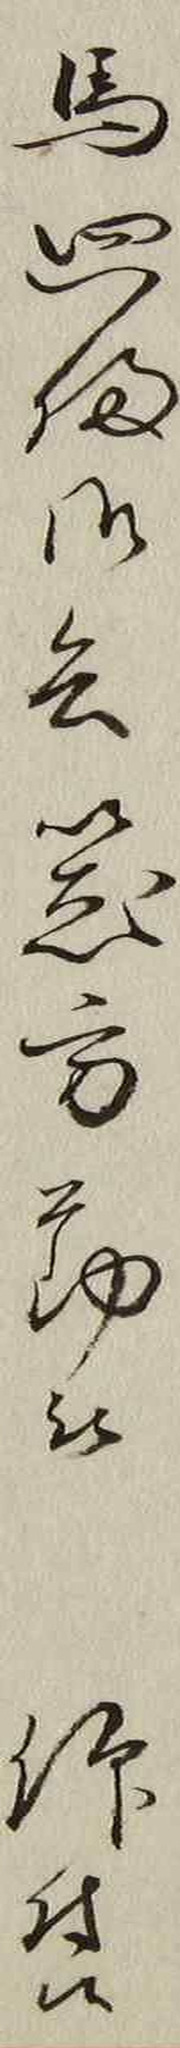馬廻備御兵器方勤被仰付候
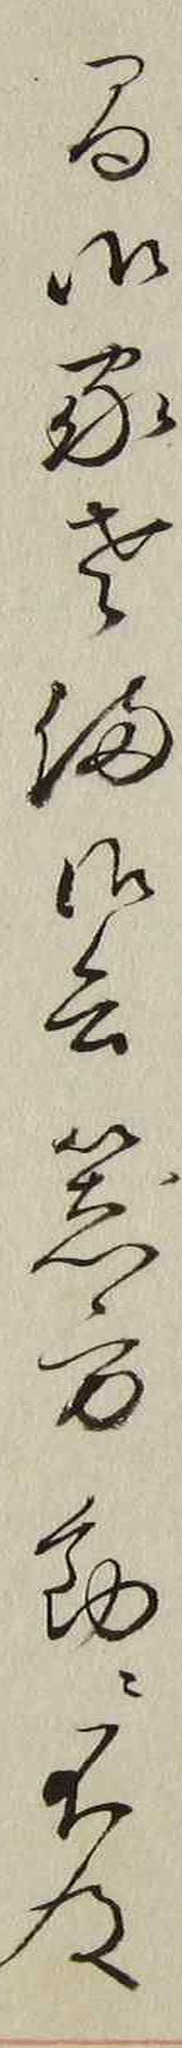間御家老備御兵器方勤ニ不及
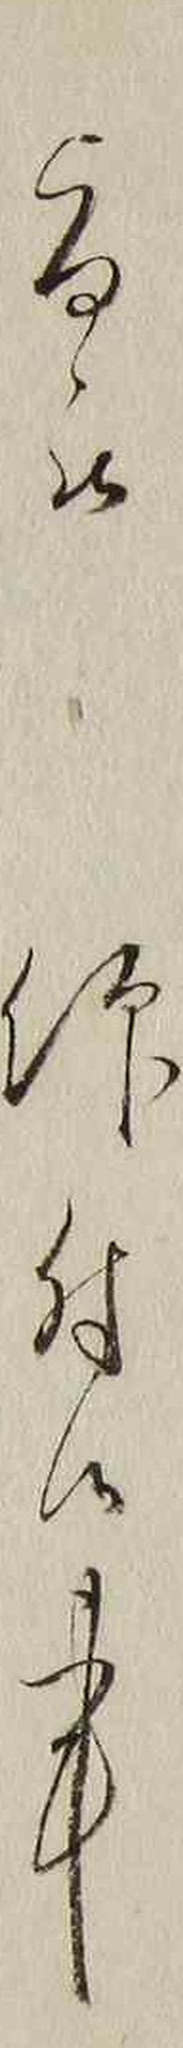旨被仰付候事
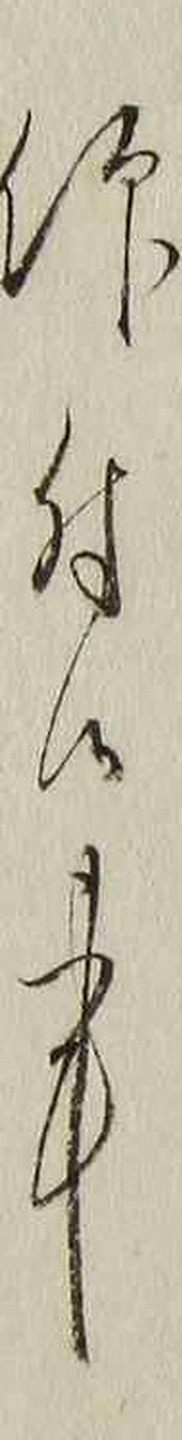仰出候事
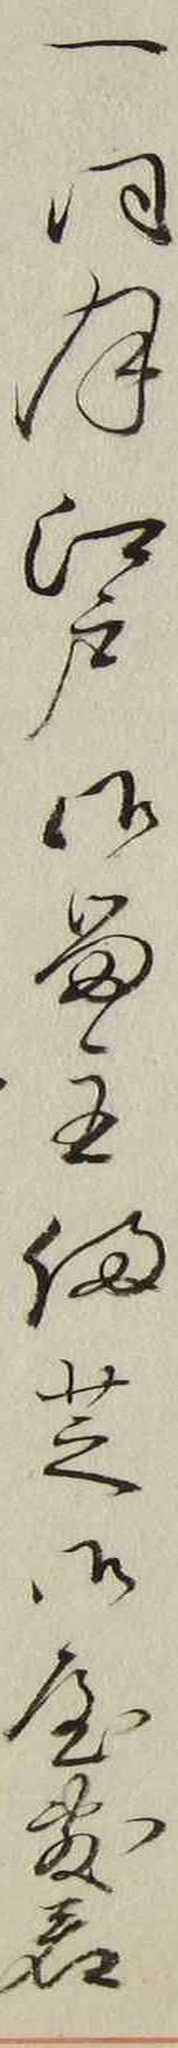一同月江戸御留守備芝御屋敷表
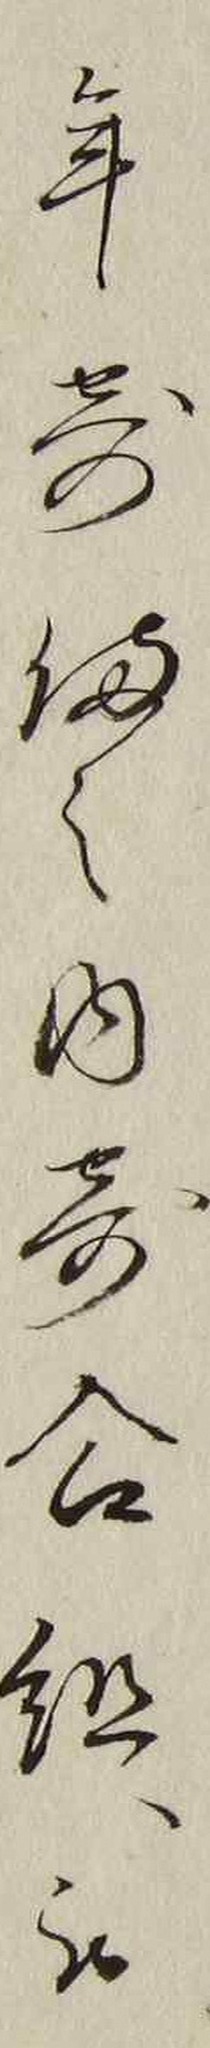年寄備之内寄合組へ被
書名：諸士系譜　巻之8　い之部8
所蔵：会津若松市立会津図書館
